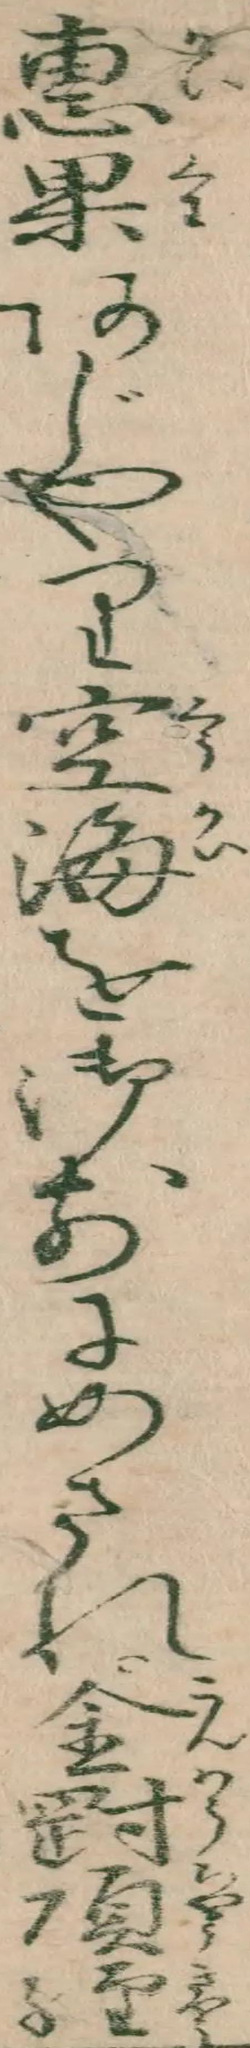恵果あじやり空海を御前にめされ。金剛頂経
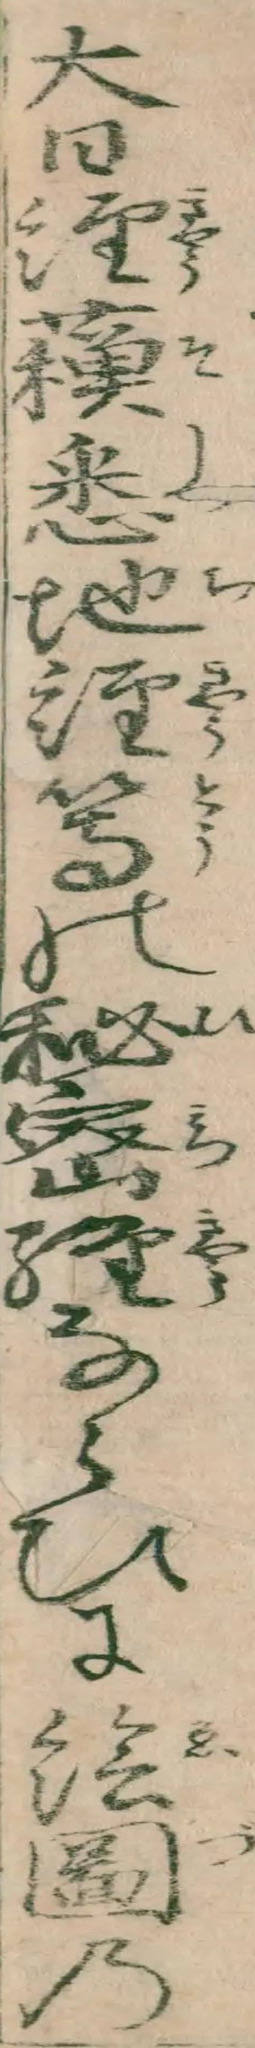大日経蘇悉地経等の秘密経ならひに絵図の
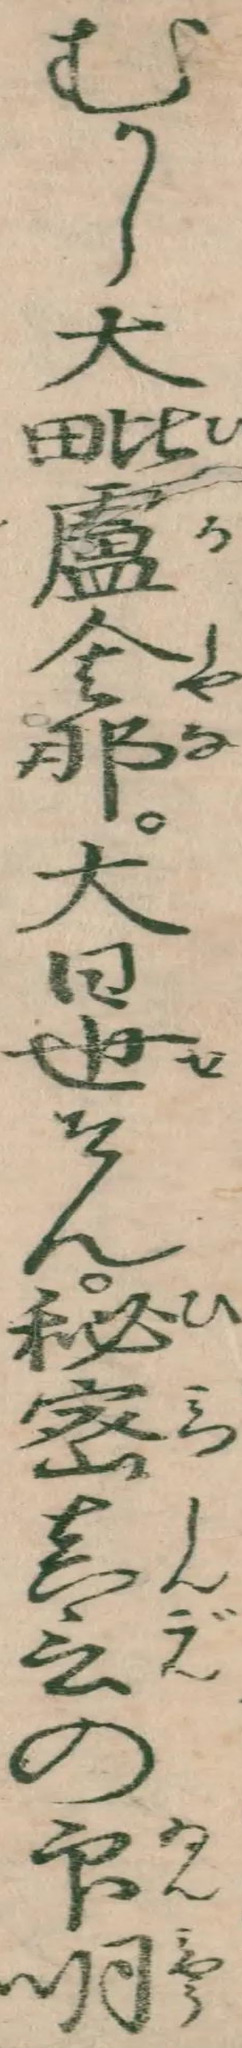むかし大毘盧遮那。大日世そん。秘密真言の印明
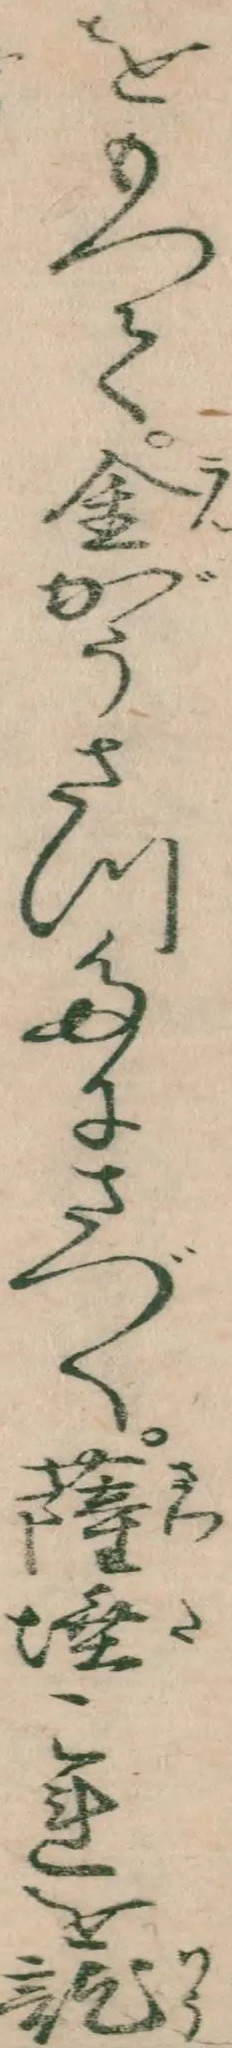をもつて。金がうさつたにさづく。薩埵これを竜
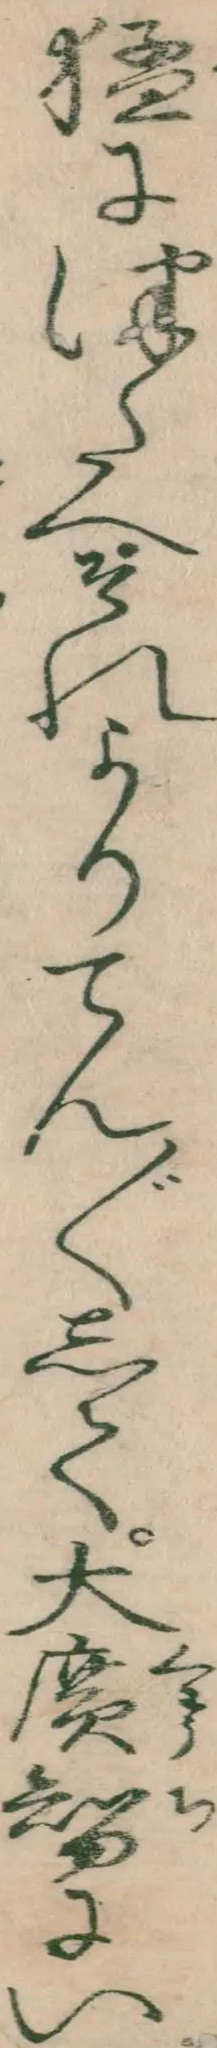猛につたへ。それよりてん〴〵して。大広智にい
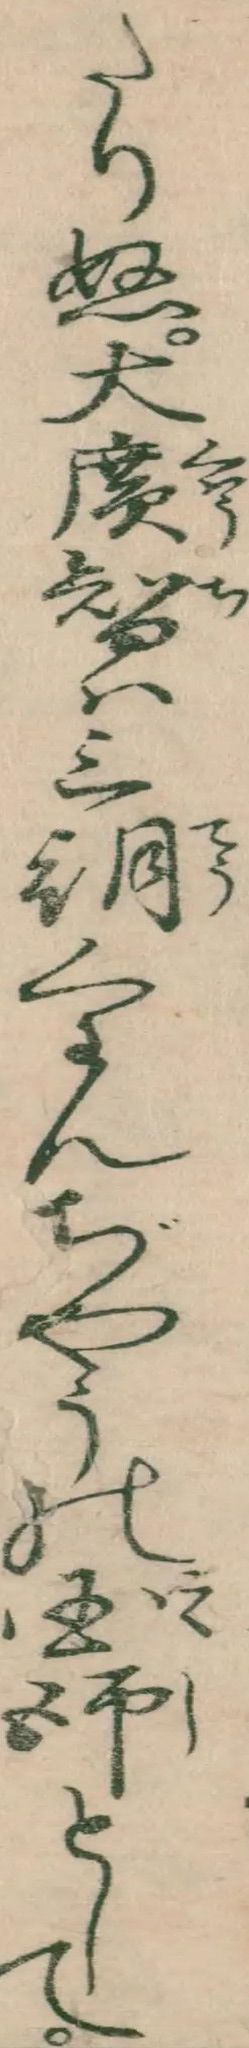たりぬ。大広智は三朝くわんぢやうの国師として。
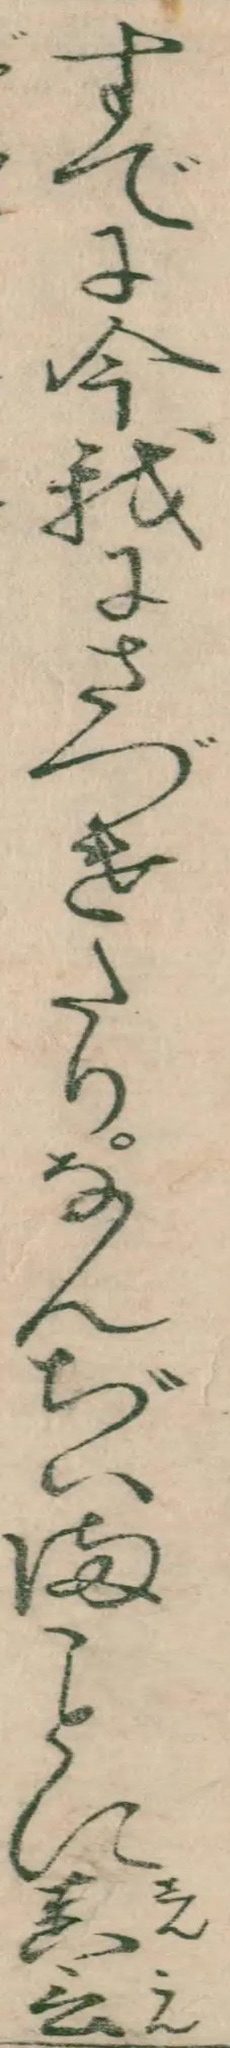すでに今我にさづけたり。なんぢはまことに真言
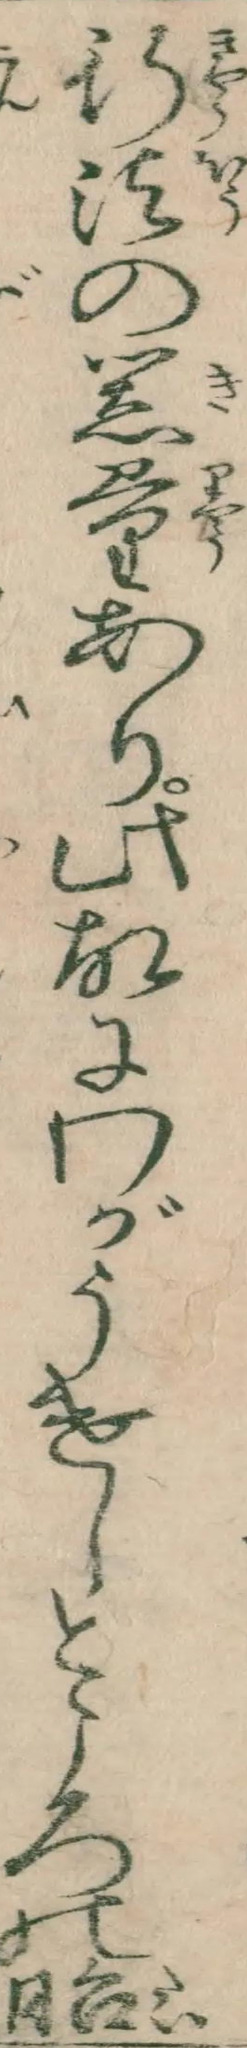行法の器量あり。此故にわがうけしところの胎
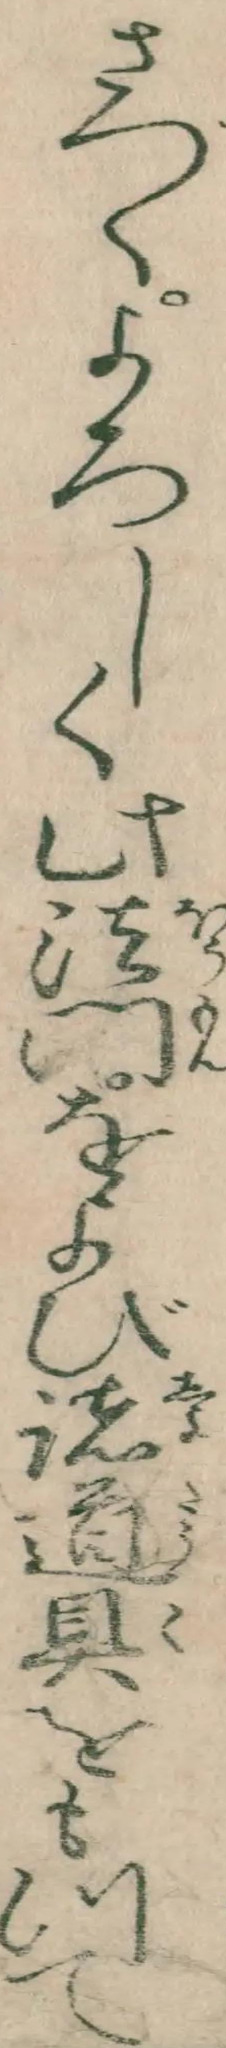さづく。よろしく此法門をよび諸道具をもつて
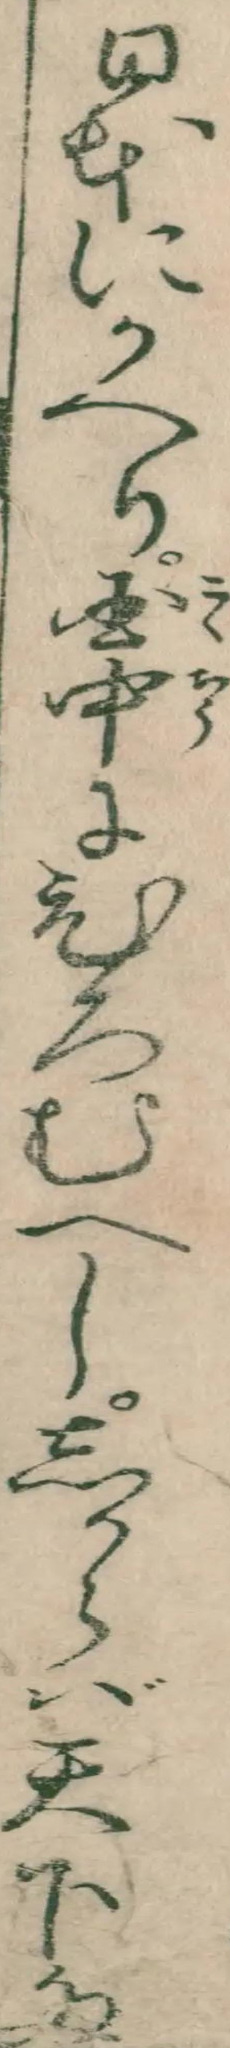日本にかへり。国中にひろむへし。しからば天下た

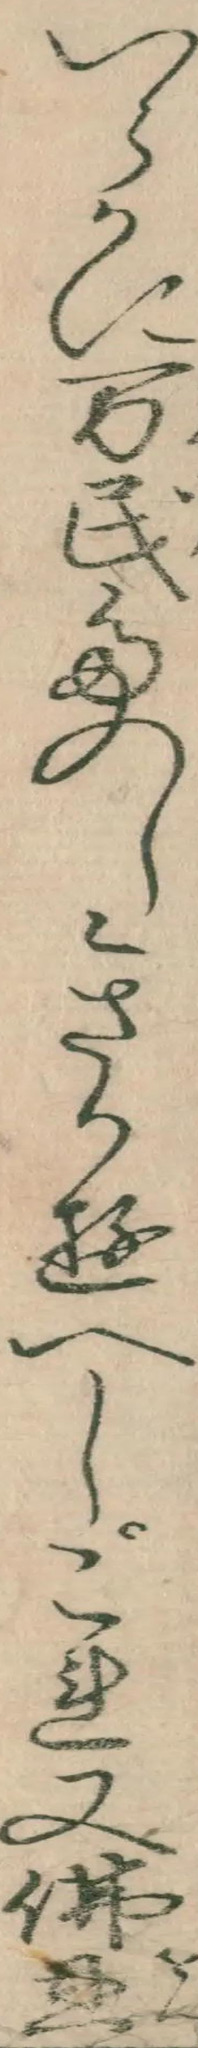いらかに万民たのしみさかゆへし。これ又仏恩
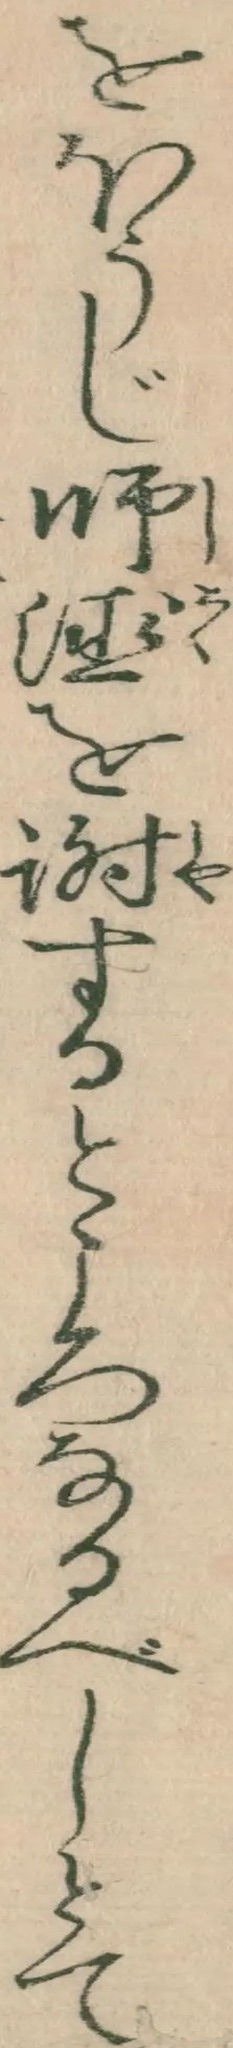をほうじ師徳を謝するところなるべしとて
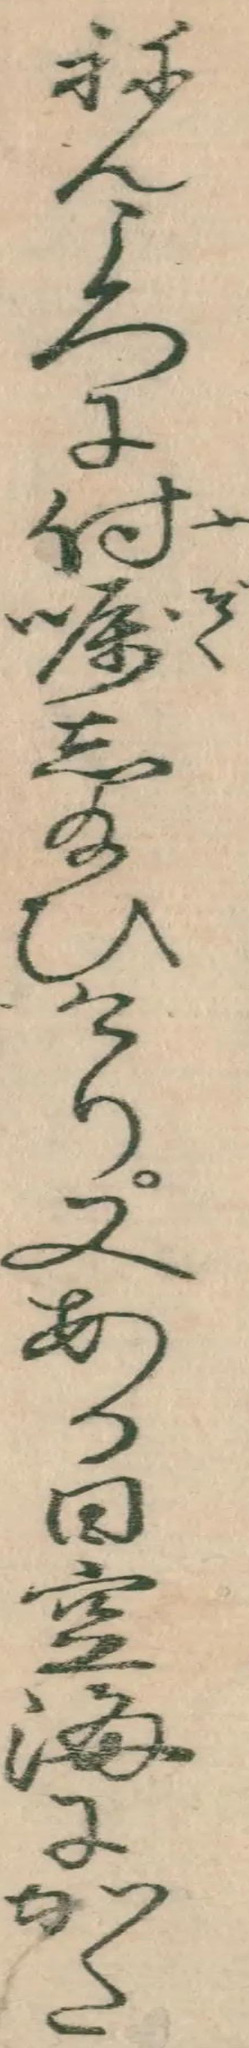ねんころに付嘱し給ひけり。又ある日空海にかた
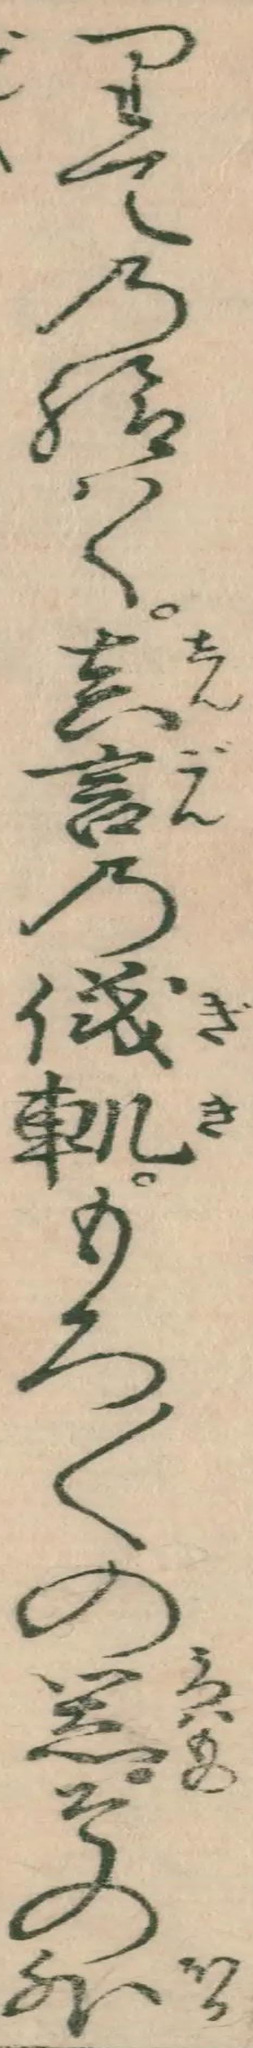りての給はく。真言の儀軌。もろ〳〵の器。その外
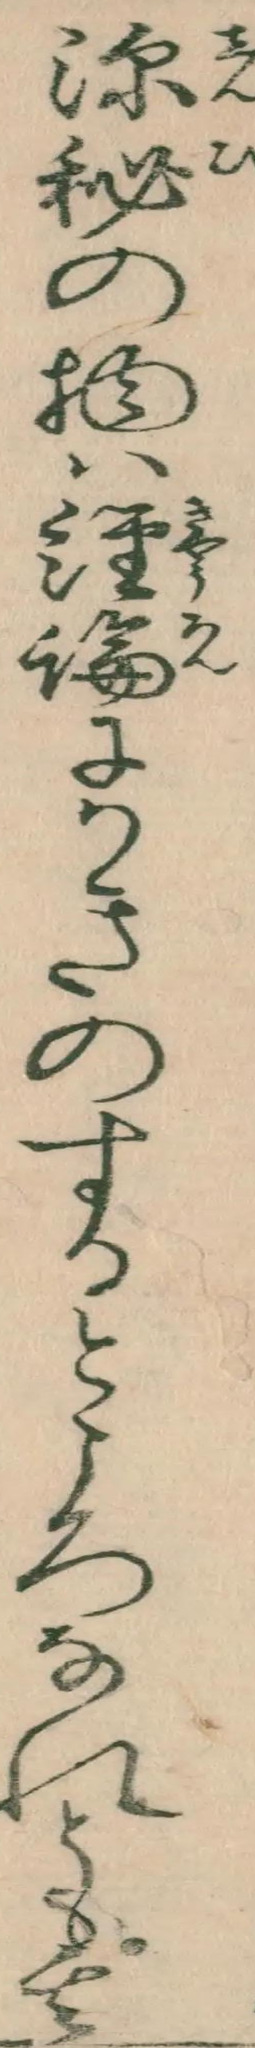深秘の物は経論にかきのするところなれとも。其
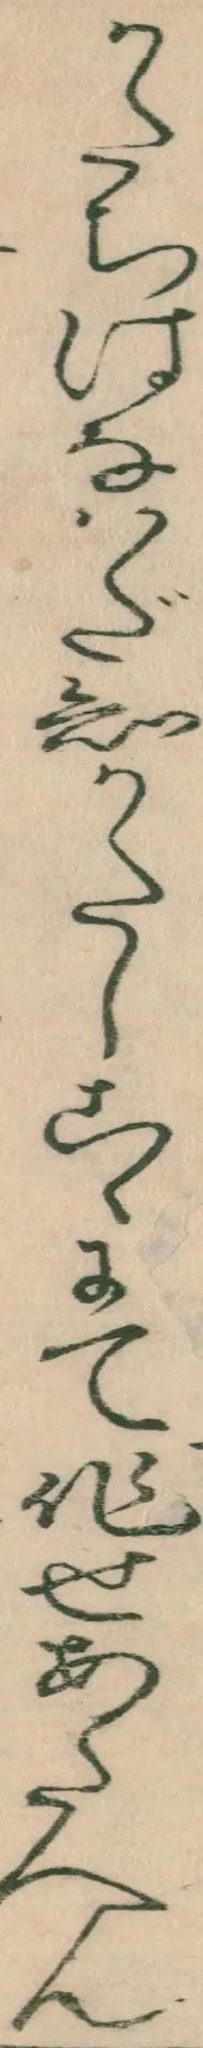かたちはなはだ知かたしこゝにて作せあたへん
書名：弘法大師御本地 3巻. [1]
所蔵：国立国会図書館 National Diet Library, JAPAN
